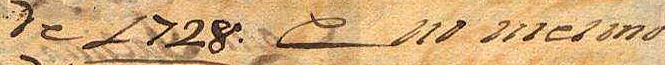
de 1728. e no mesmo
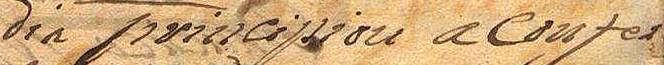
dia principiou a confes
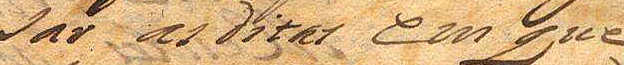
sar as ditas em que
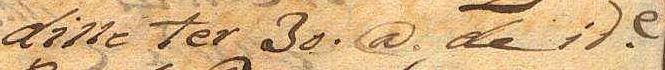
disse ter 30. ā. de id.e
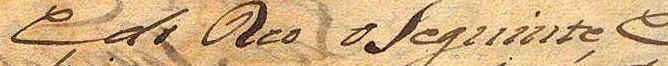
e do Reo o seguinte, e
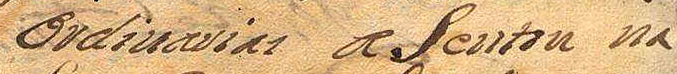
Ordinarias asentou na
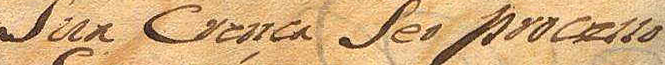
sua crença seo processo
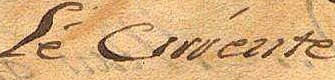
hé corrente
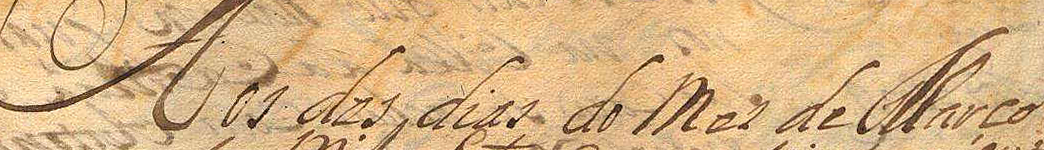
Aos des dias do mes de Março
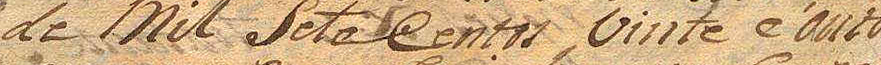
de mil setecentos vinte e outo
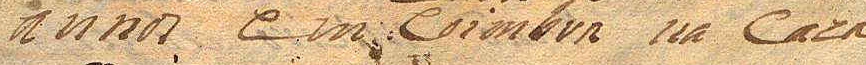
annos em coimbra na caza
